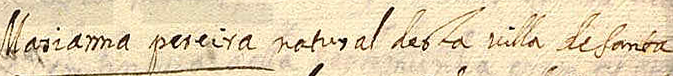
Marianna pereira natural desta uilla de Santa
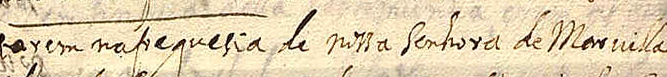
tarem na freguesia de nossa Senhora de Maruilla
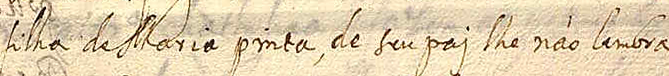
filha de Maria pinta, de seu paj lhe não lembra
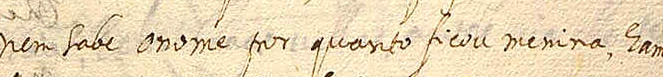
nem sabe o nome por quanto ficou menina, E am
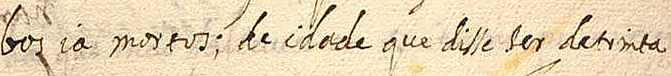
bos ia mortos; de idade que disse ser de trinta
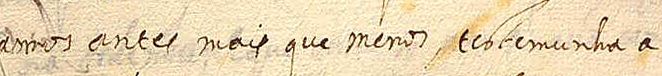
annos antes mais que menos, testemunha a
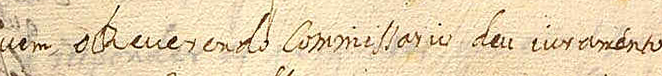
uem o Reuerendo Commissario deu iuramento
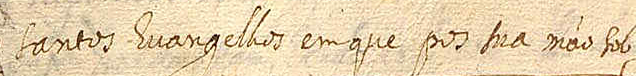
Santos Euangelhos em que pos sua mão sob
